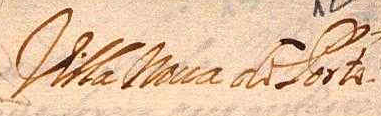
Villa Noua do Porto
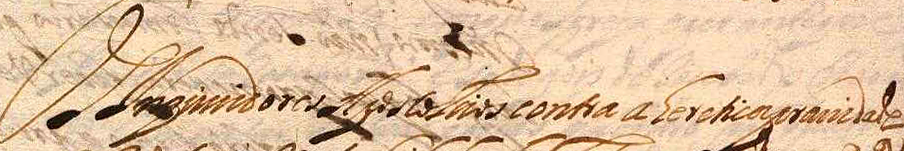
Os Inquisidores Apostolicos contra a heretica prauidade
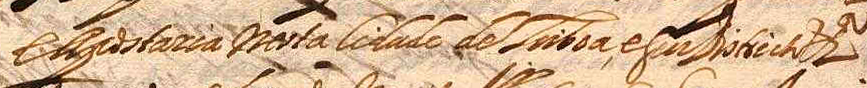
e Apostazia nesta Cidade de Lisboa, e seu districto &a
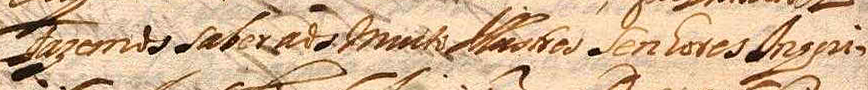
Fazemos saber aos muito Illustres Senhores Inqui
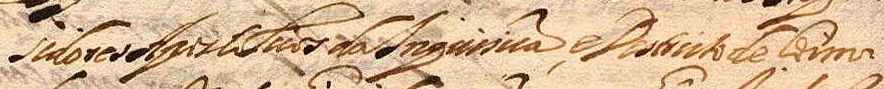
sidores Apostolicos da Inquisicaõ, e Destricto de Coim
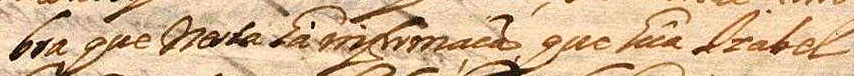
bra que nesta há informação que hūa Izabel
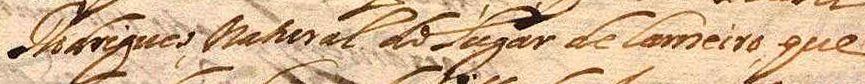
Rodrigues natural do Lugar de Cameiro, que
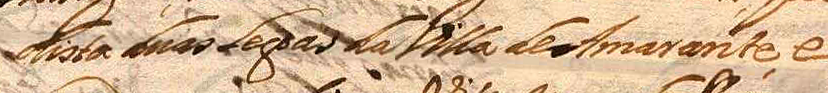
dista duas legoas da Villa de Amarante, e
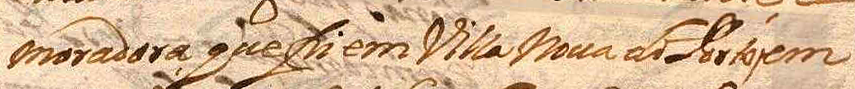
moradora que foi em Villa noua do Porto, em
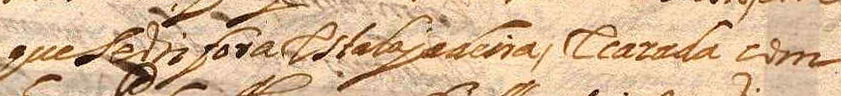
que se dis fora Estalajadeira, e cazada com
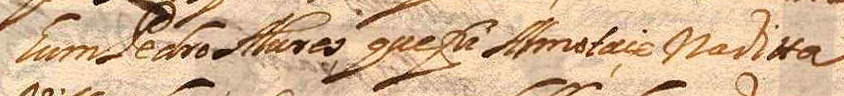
hum Pedro Alures, que foi Almotaçe na ditta
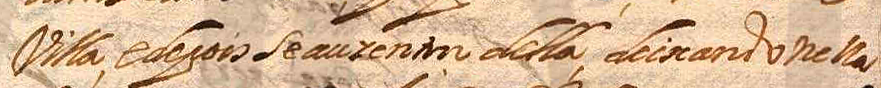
Villa, e depois se auzentou della, deixando nella
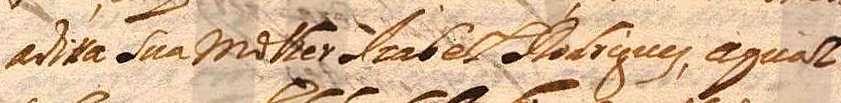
a ditta sua molher Izabel Rodrigues, a qual
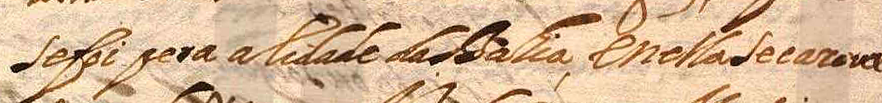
se foi pera a Cidade da Bahia, e nella se cazou
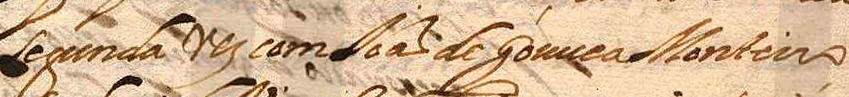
segunda vez com Ioaõ de gouuea Monteiro,
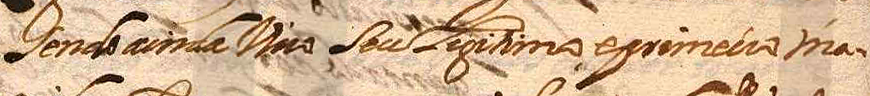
sendo ainda viuo seu Legitimo, e primeiro ma
